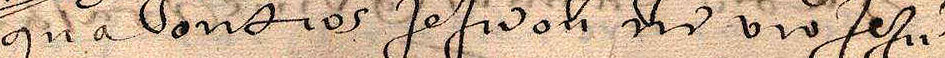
qua outros JeJūou nē vio JeJū
